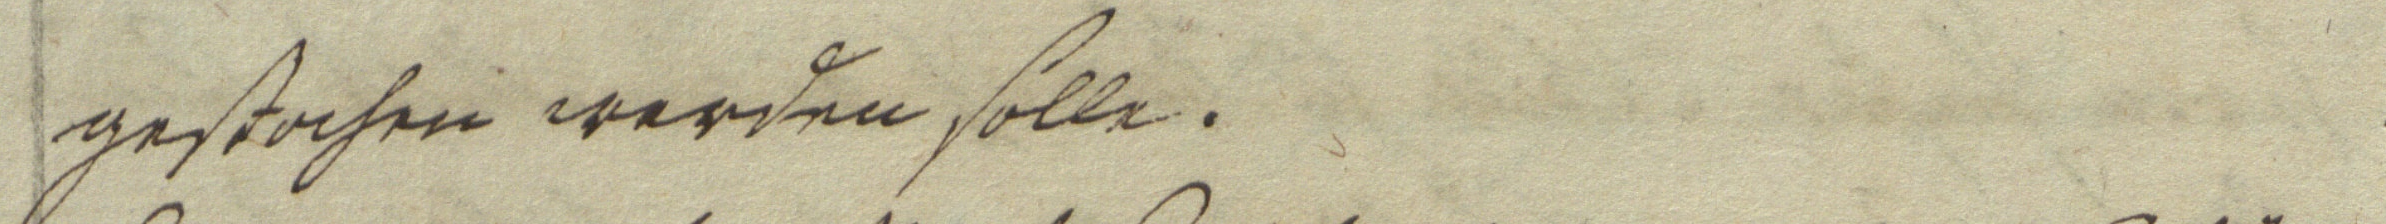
gestochen werden solle.
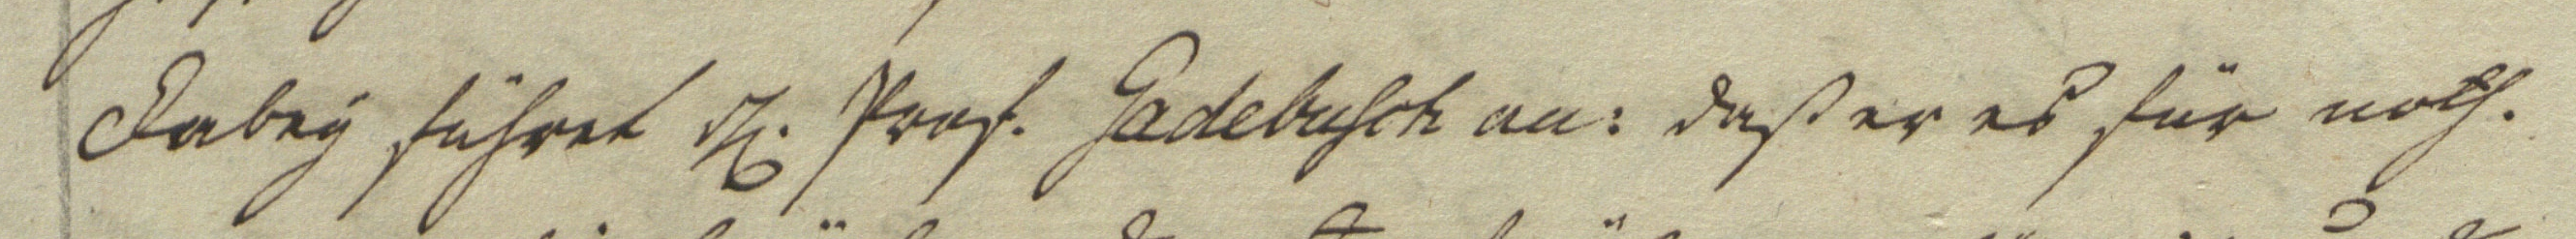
Dabey führet dh. Prof. Gadebusch an: daß er es für noth¬
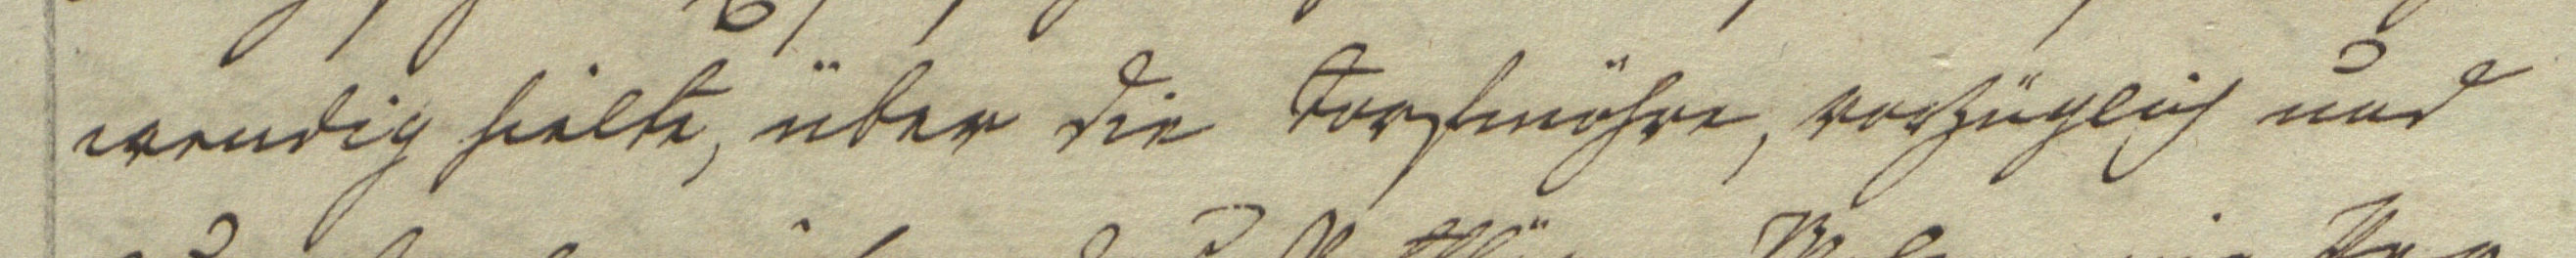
wendig hielte, über die Tormöhre, vorzüglich und
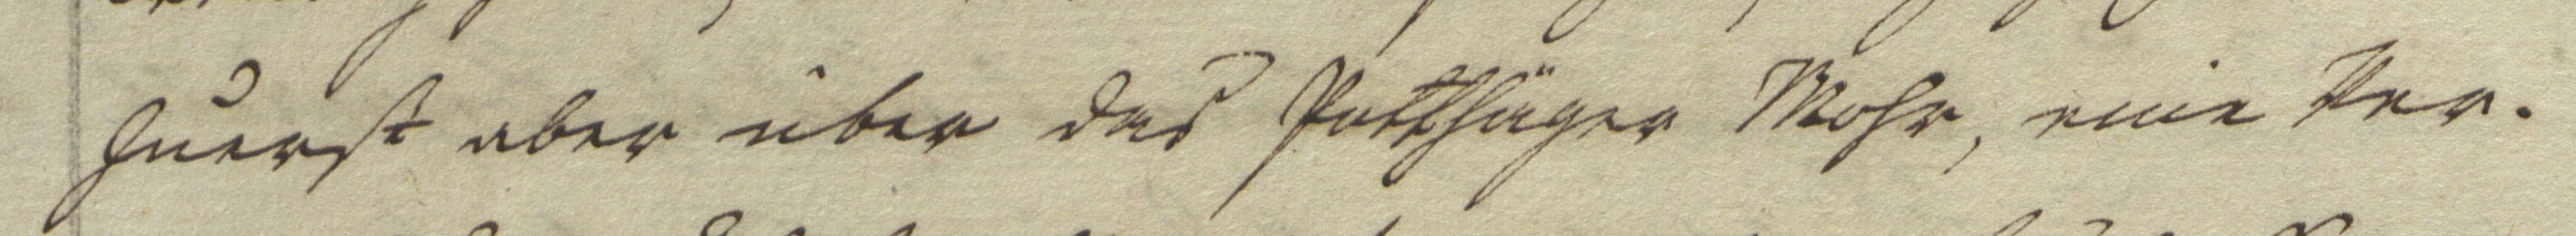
zuerst aber über das Potthäger Mohr, eine Ver-
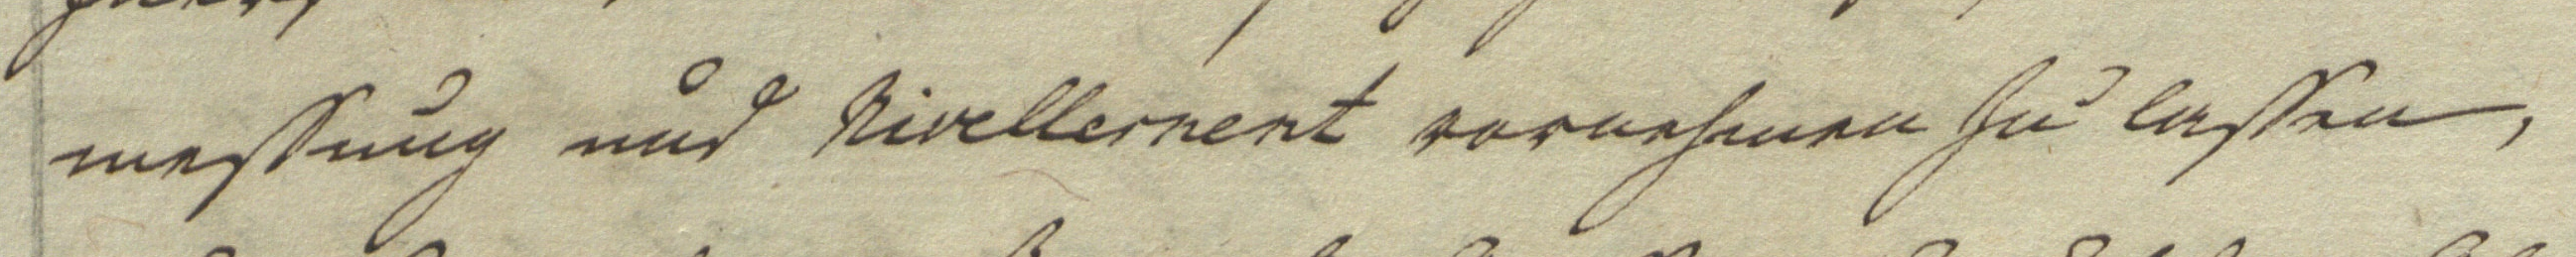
messung und Nivellement vornehmen zu lassen,
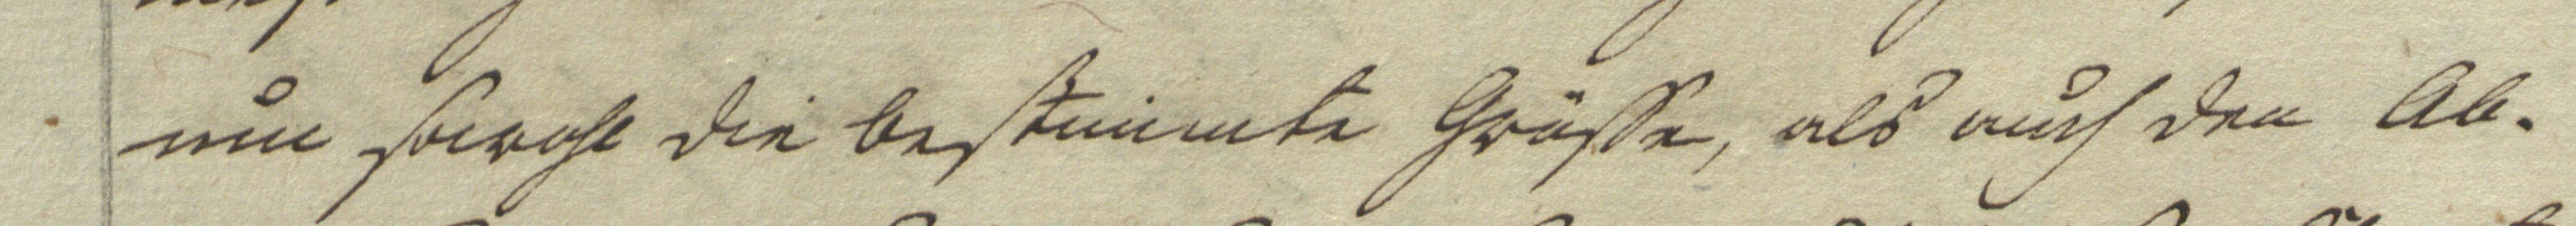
um sowohl die bestimmte Grösse, als auch den Ab¬
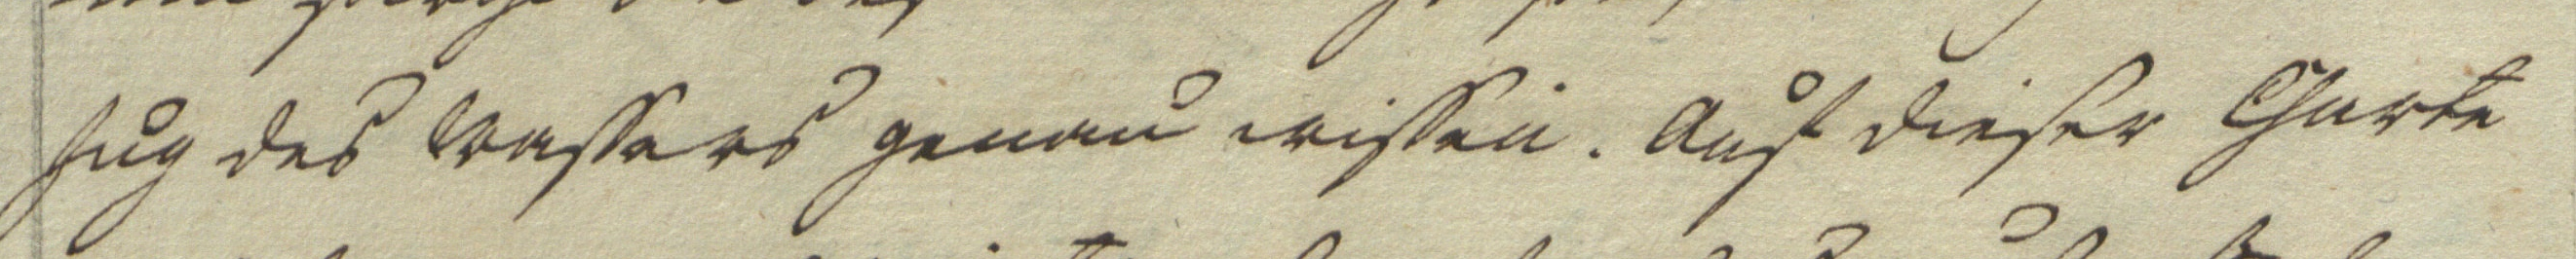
zug des Wassers genau wissen. Auf dieser Charte
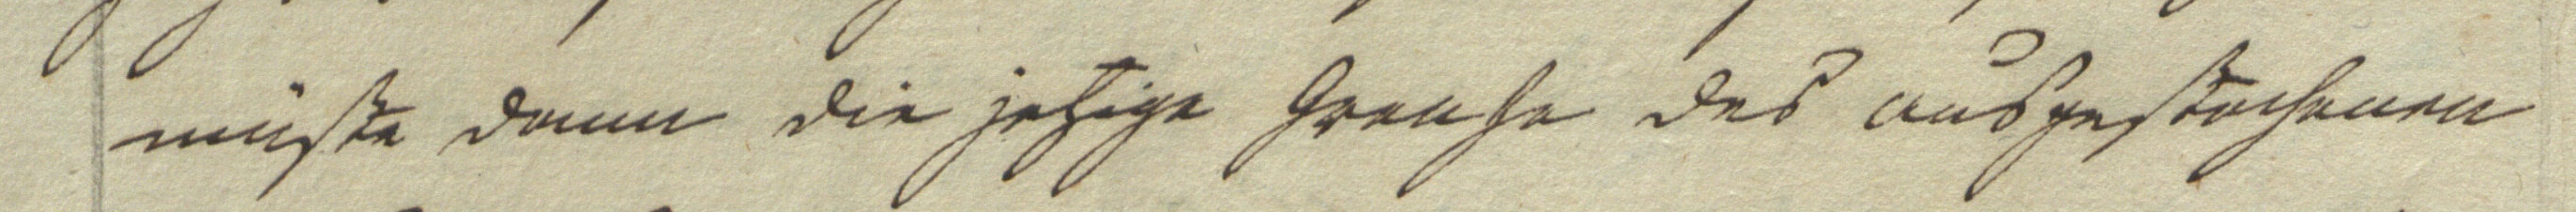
müßte dann die jetzige Grenze des ausgestochenen
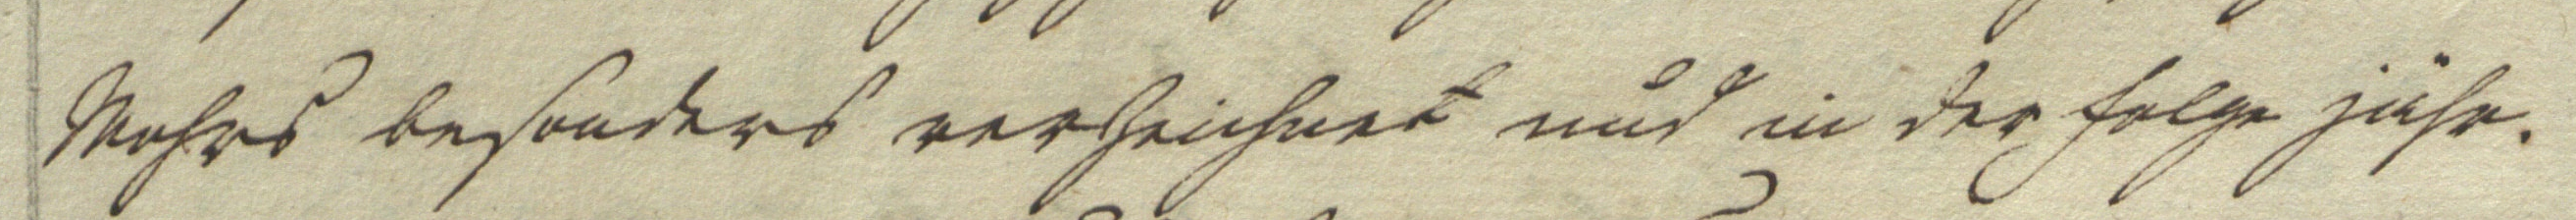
Mohres besonders verzeichnet und in der Folge jähr¬
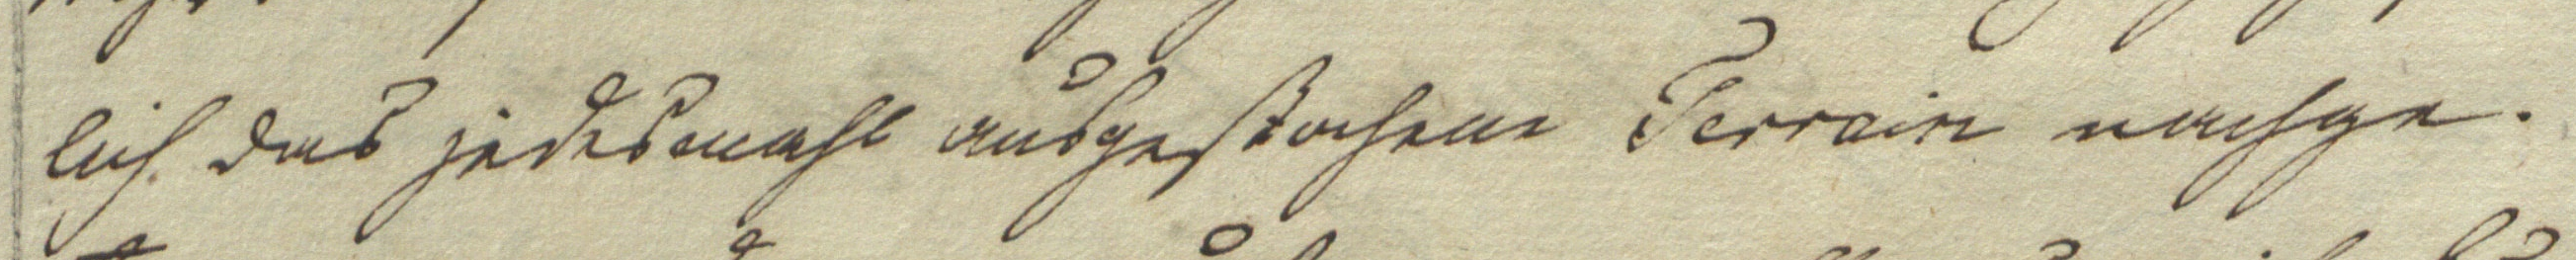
lich das jedesmahl ausgestochene Terrain nachge¬
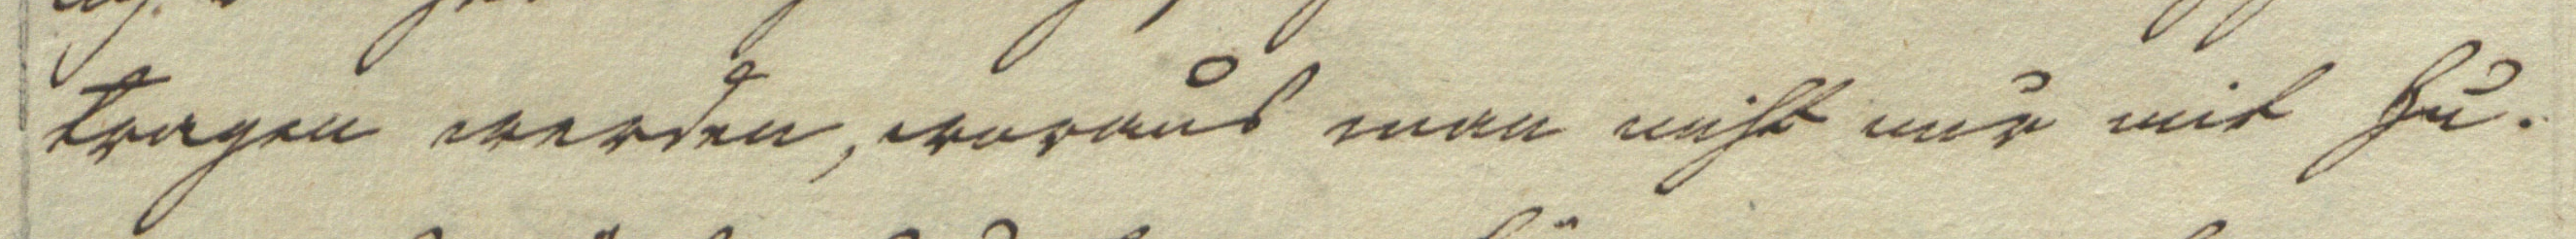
tragen werden, woraus man nicht nur mit Zu¬
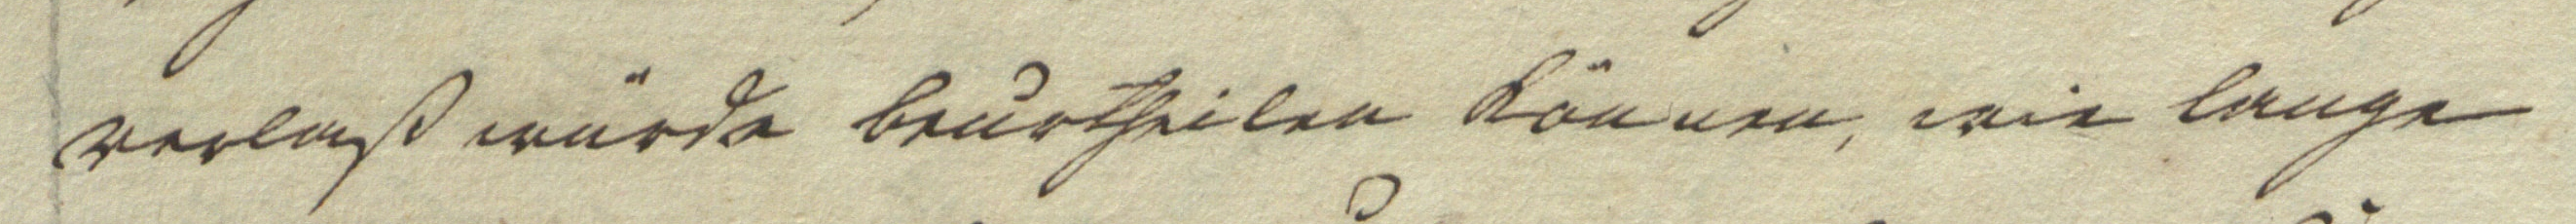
verlaß würde beurtheilen können, wie lange
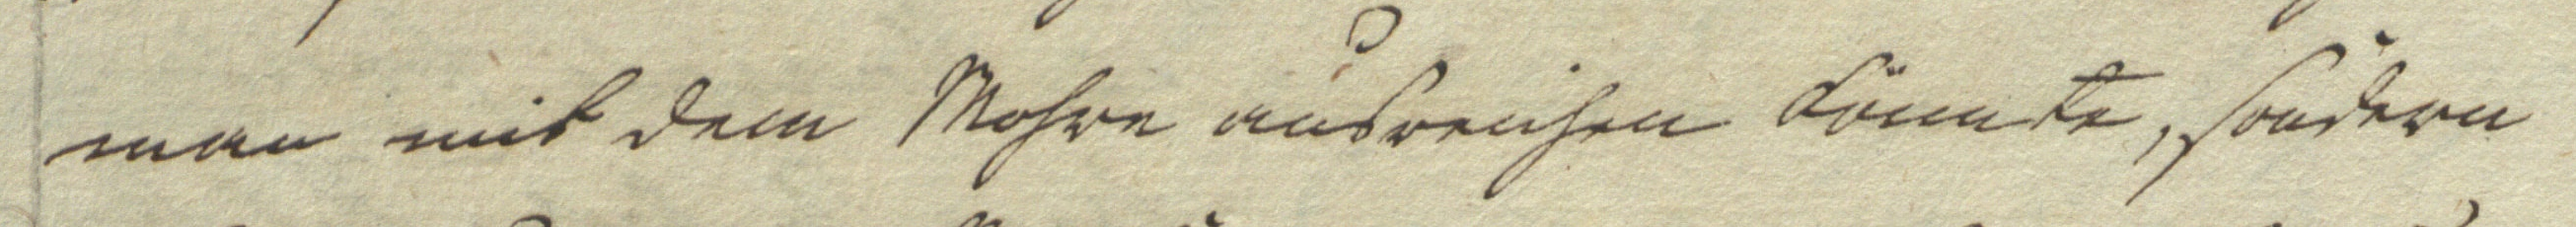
man mit dem Mohre ausreichen könnte, sondern
